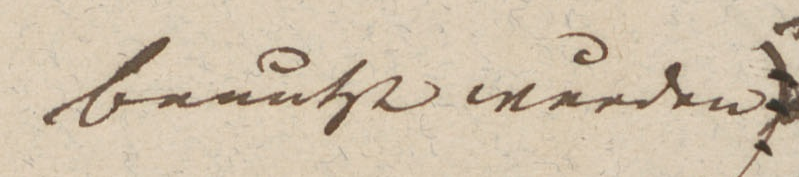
benutzt wurden)
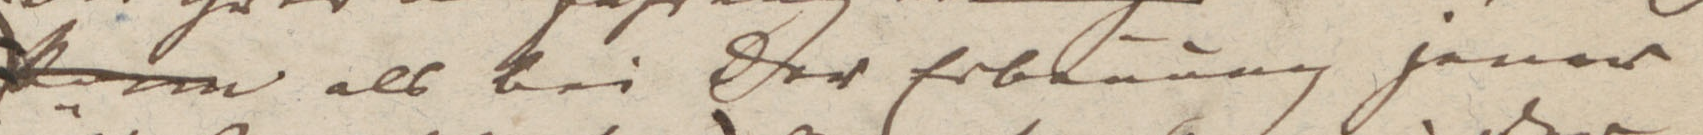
kam als bei der Erbauung jener
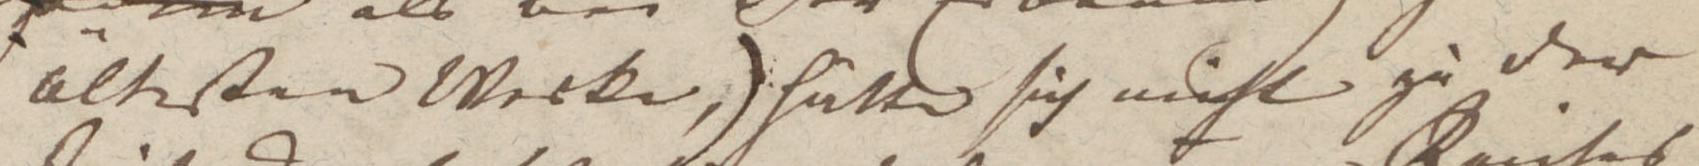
ältesten Werke,) hätte sich nicht zu der
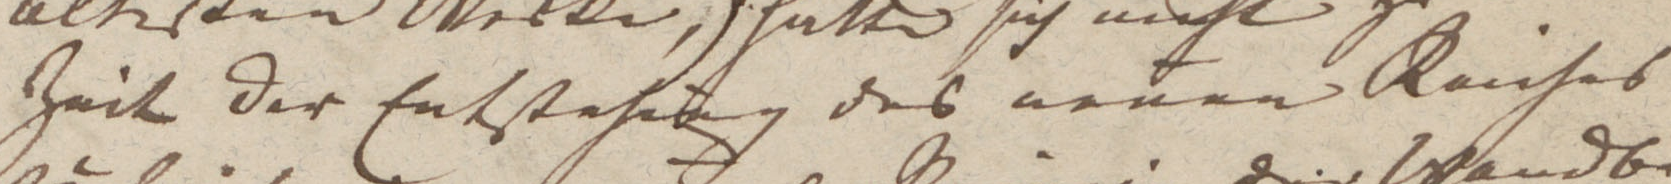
Zeit der Entstehung des neuen Reiches
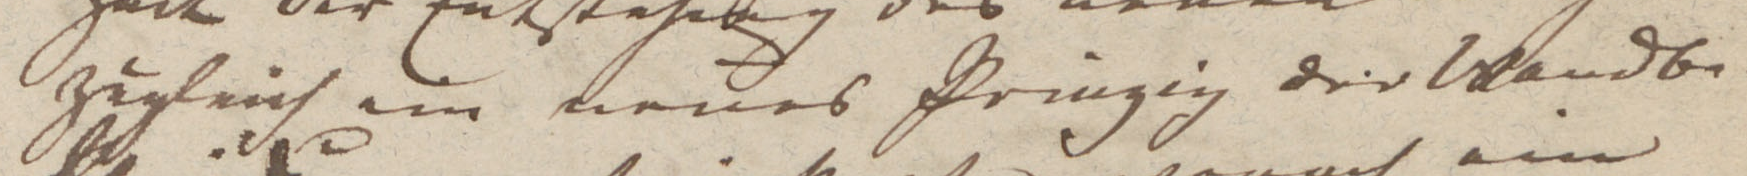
zugleich ein neues Prinzip der Wandbe-
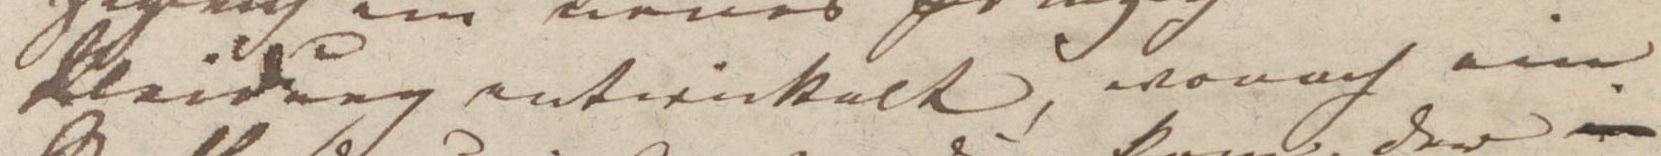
kleidung entwickelt, wonach ein
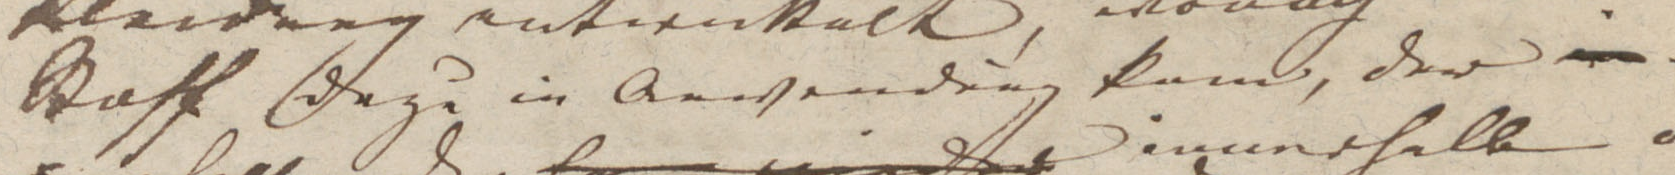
Stoff dazu in Anwendung kam, der in-
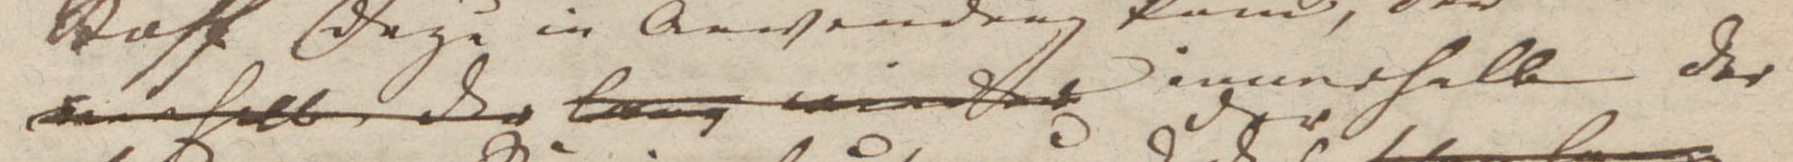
nerhalb der lang wieder innerhalb der
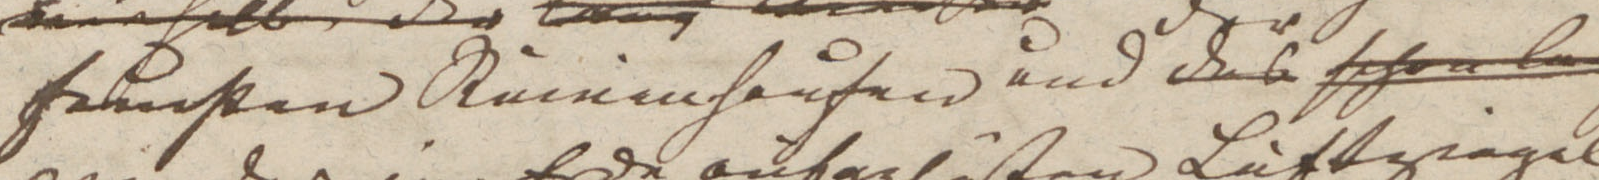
feuchten Ruinenhaufen und des der schon lange
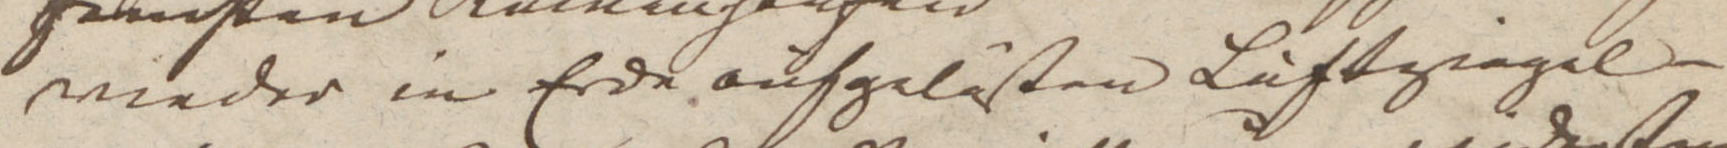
wieder in Erde aufgelösten Luftziegel-
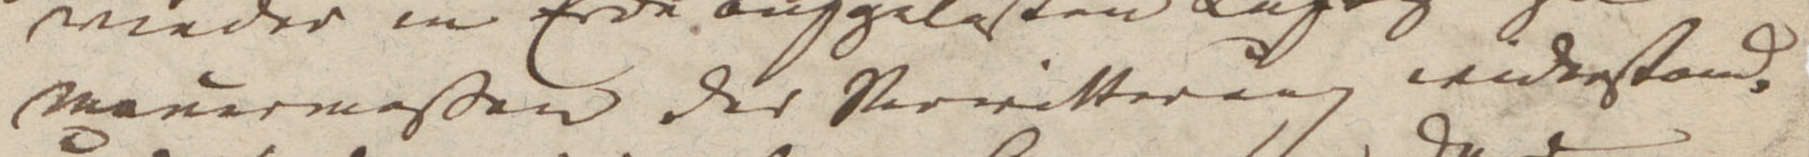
mauermassen der Verwitterung widerstand.
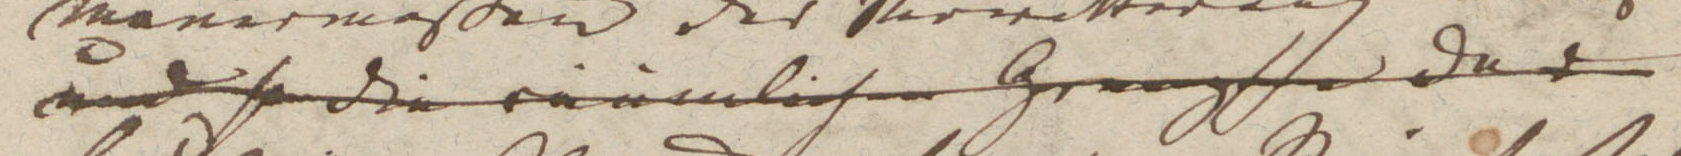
und so die räumlichen Grenzen der
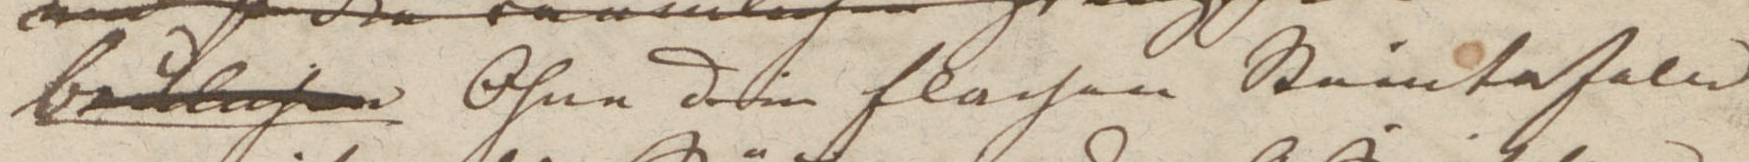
baulichen Ohne die flachen Steintafeln
